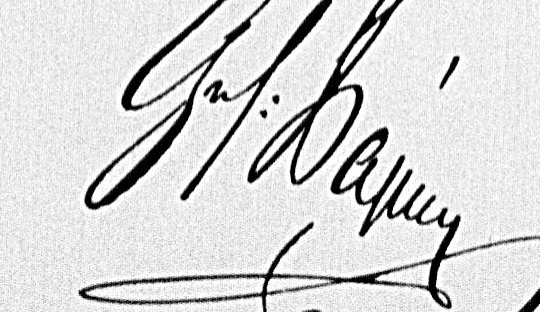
Ges:xx
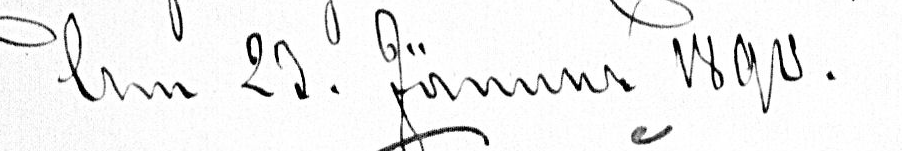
Am 23. Jänner 1890.
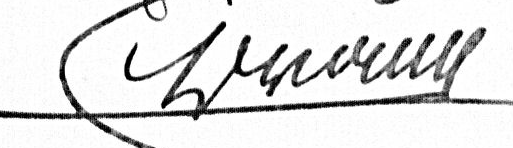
xx
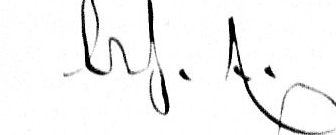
Ah. E.
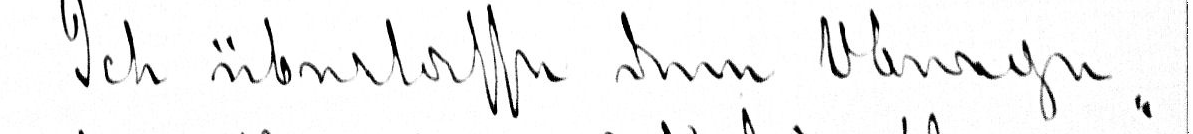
Ich überlasse dem Oberge¬
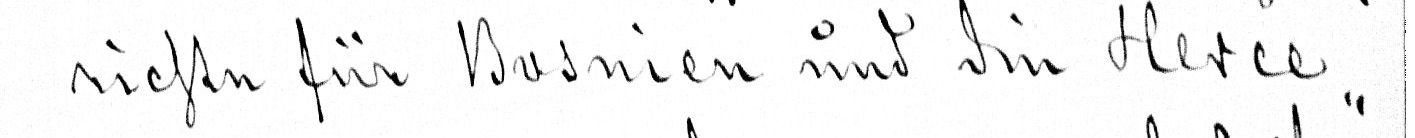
richte für Bosnien und die Herce¬
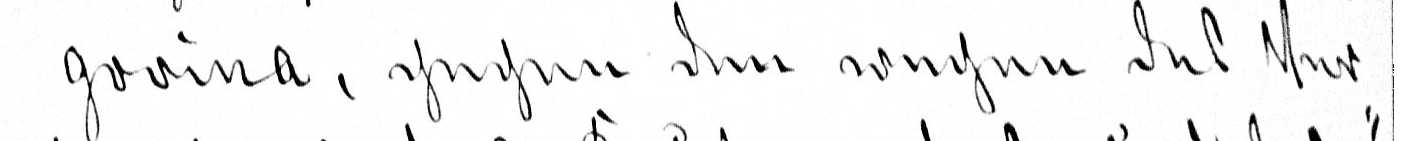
govina, gegen den wegen des Ver¬
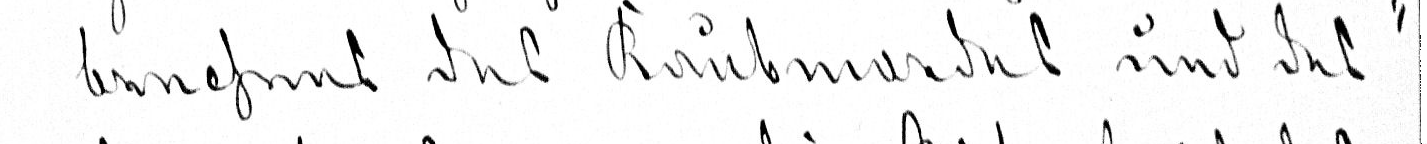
brechens des Raubmordes und des
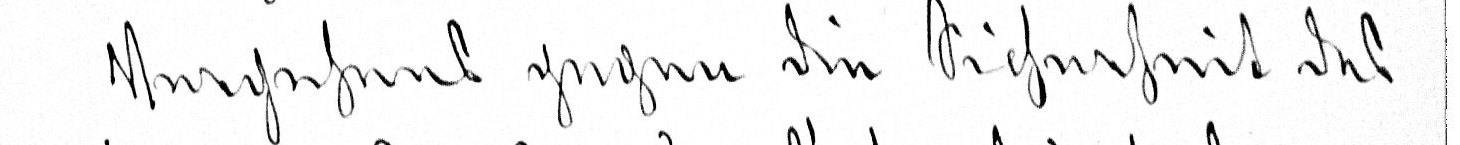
Vergehens gegen die Sicherheit des
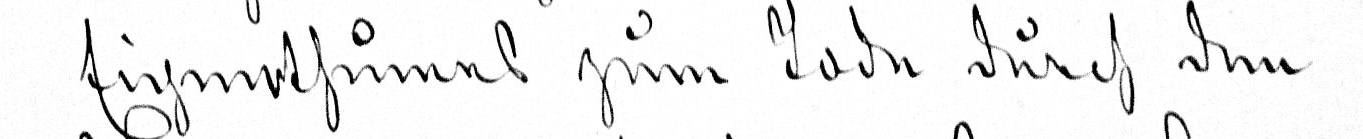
Eigenthumes zum Tode durch den
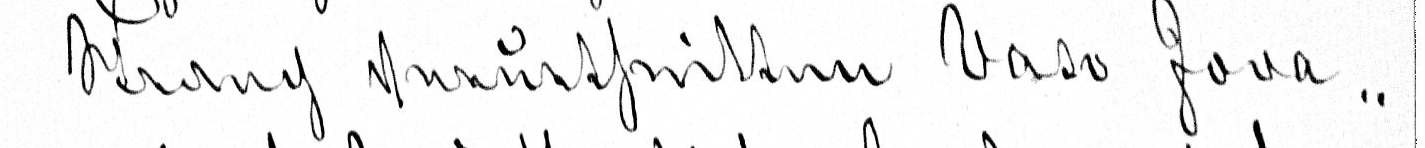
Strang verurtheilten Vaso Jova
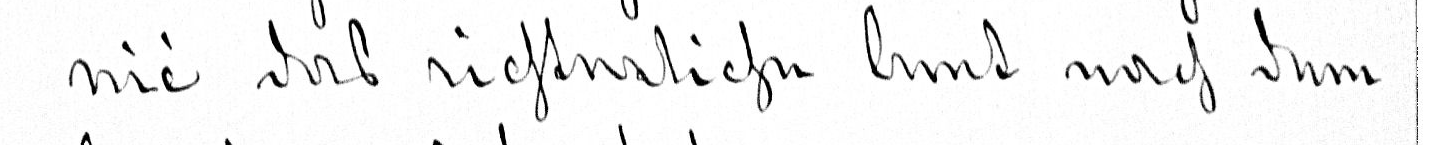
nić das richterliche Amt nach dem
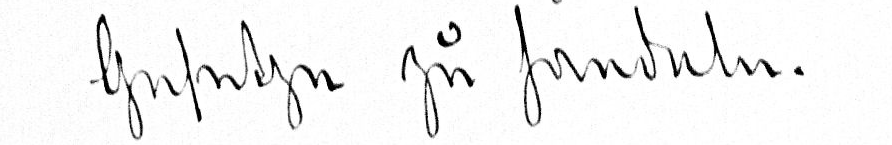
Gesetze zu handeln.
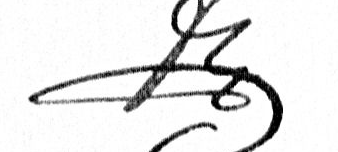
xx
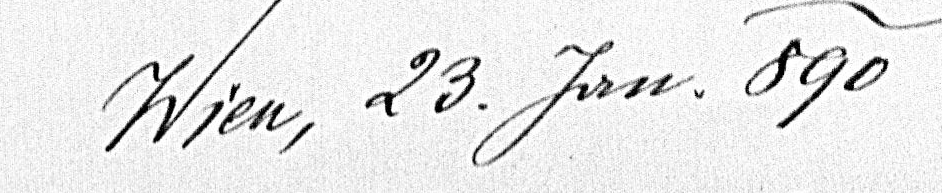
Wien, 23. Jan. 890
